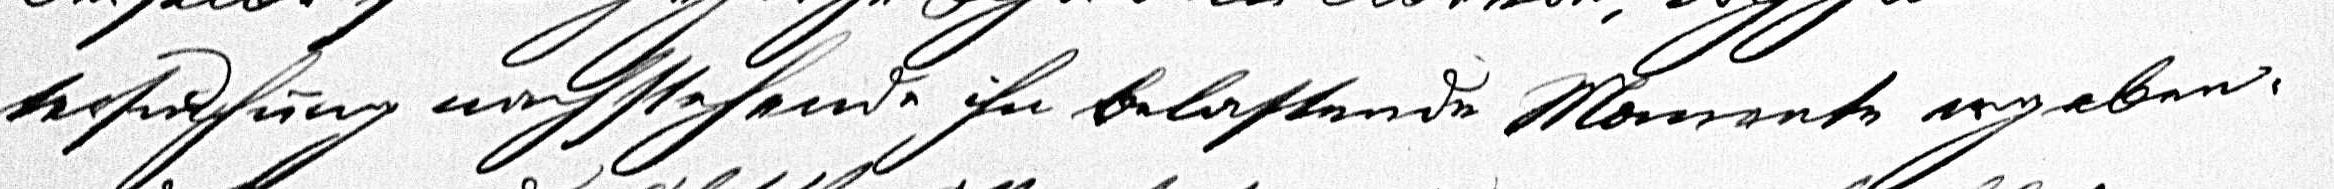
tersuchung nachstehende ihn belastende Momente ergeben.
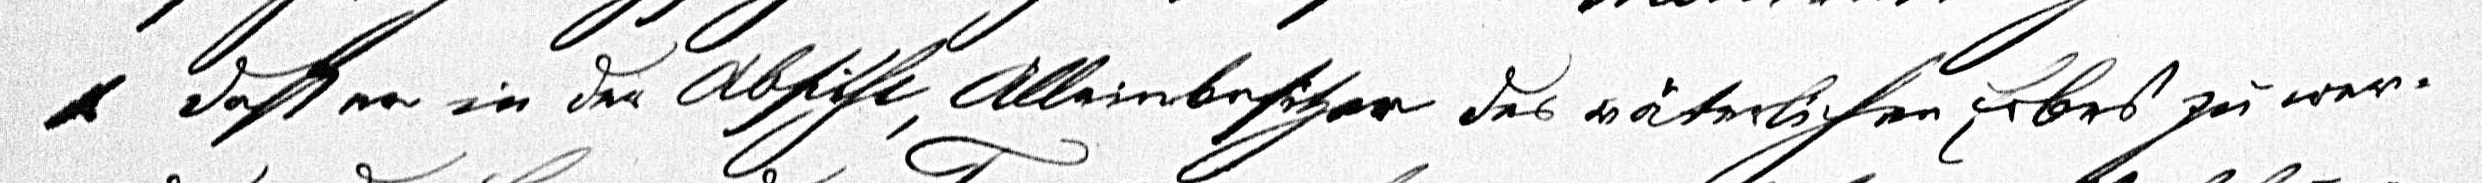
1. Daß er in der Absicht, Alleinbesitzer des väterlichen Erbes zu wer¬
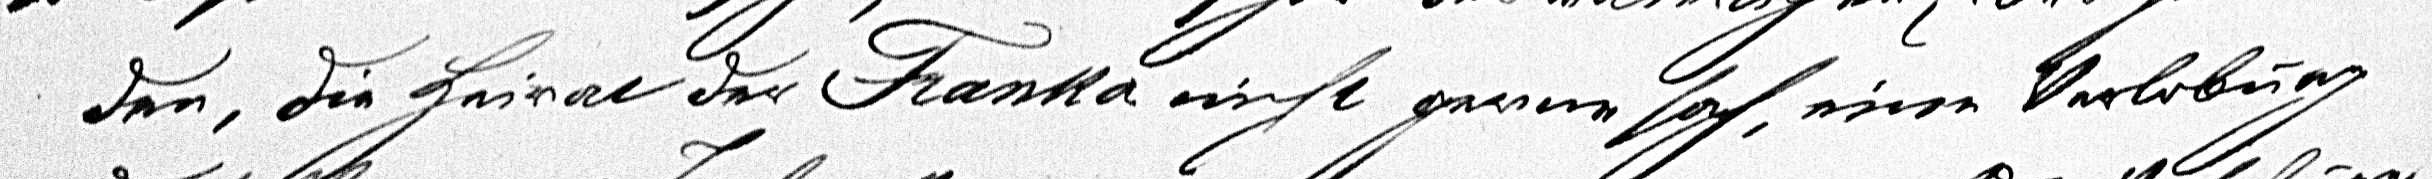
den, die Heirat der Franka nicht gerne sah, eine Verlobung
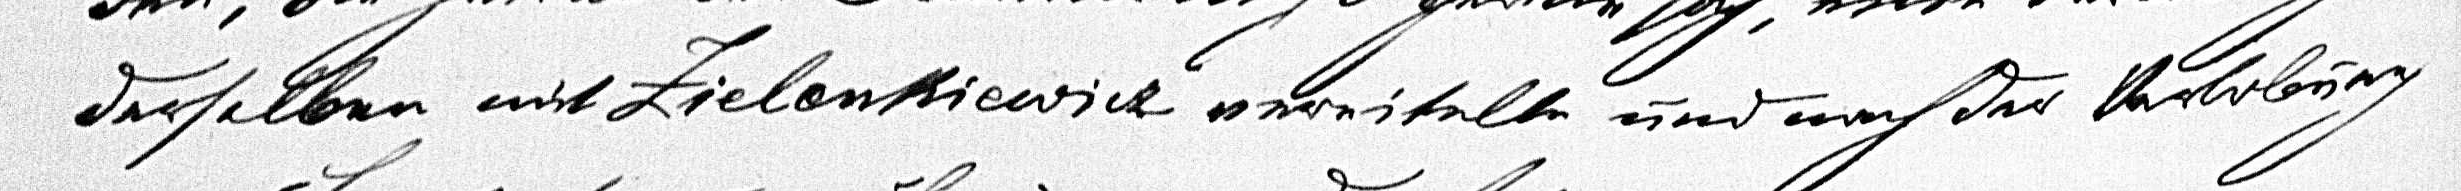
derselben mit Zielonkiewicz vereitelt und nach der Verlobung
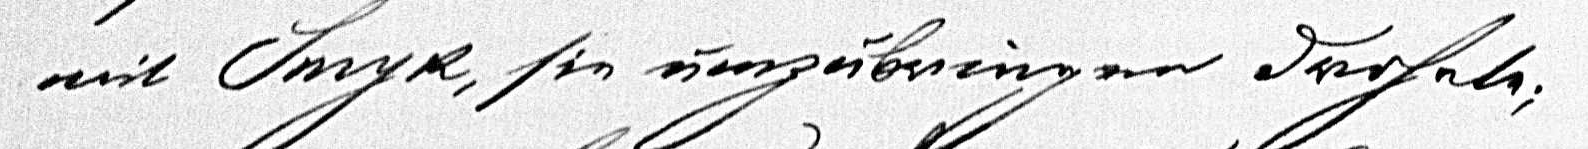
mit Smyk, sie umzubringen drohete;
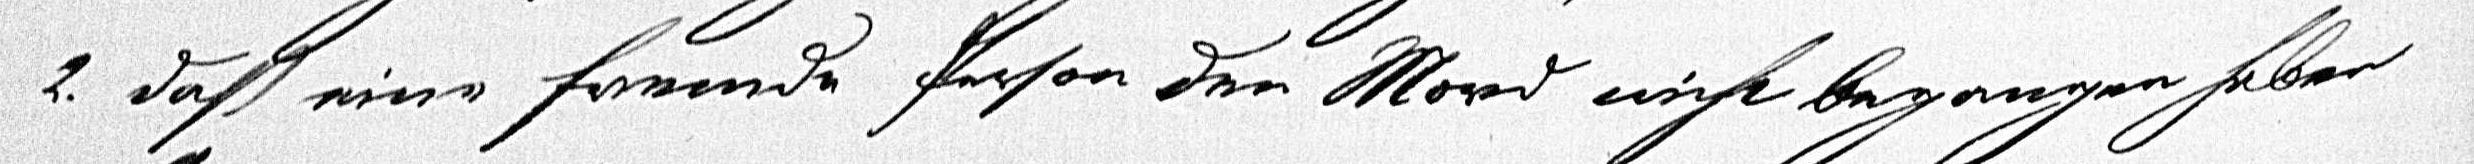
2. daß eine fremde Person der Mord nicht begangen haben
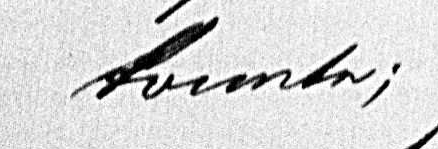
konnte;
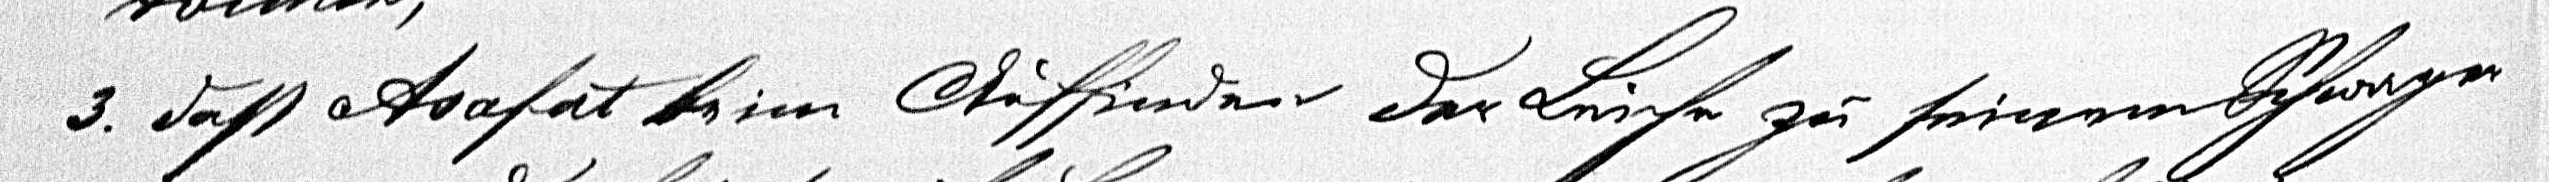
3. daß Asafat beim Auffinden der Leiche zu seinem Schwager
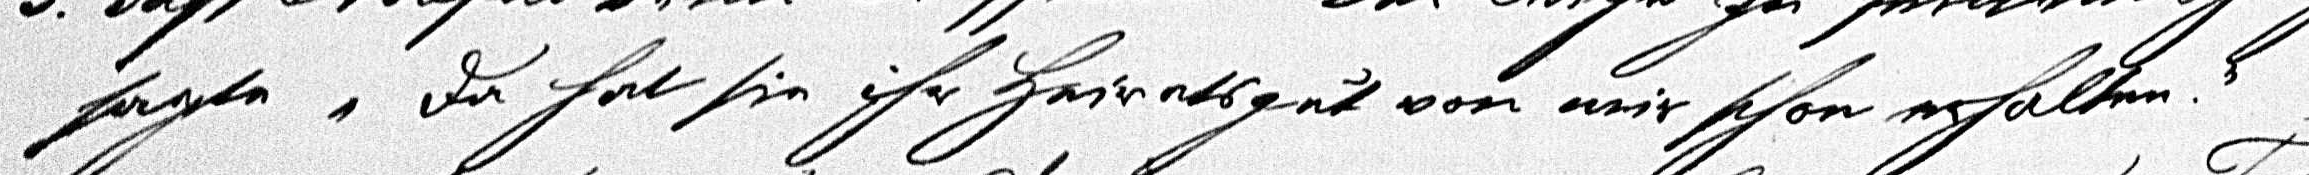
sagte „Da hat sie ihr Heiratsgut von mir schon erhalten.“
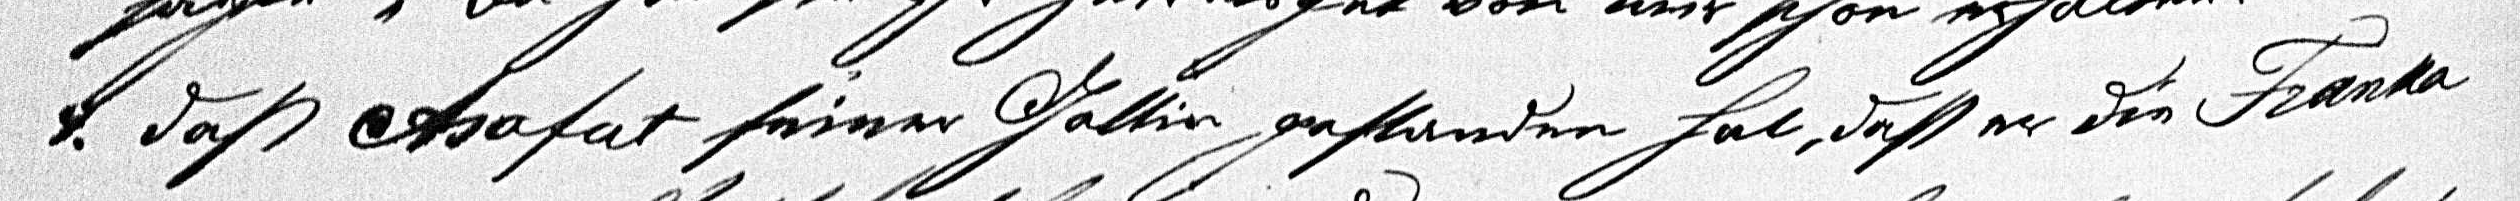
4. daß Asafat seiner Gattin gestanden hat, daß er die Franka
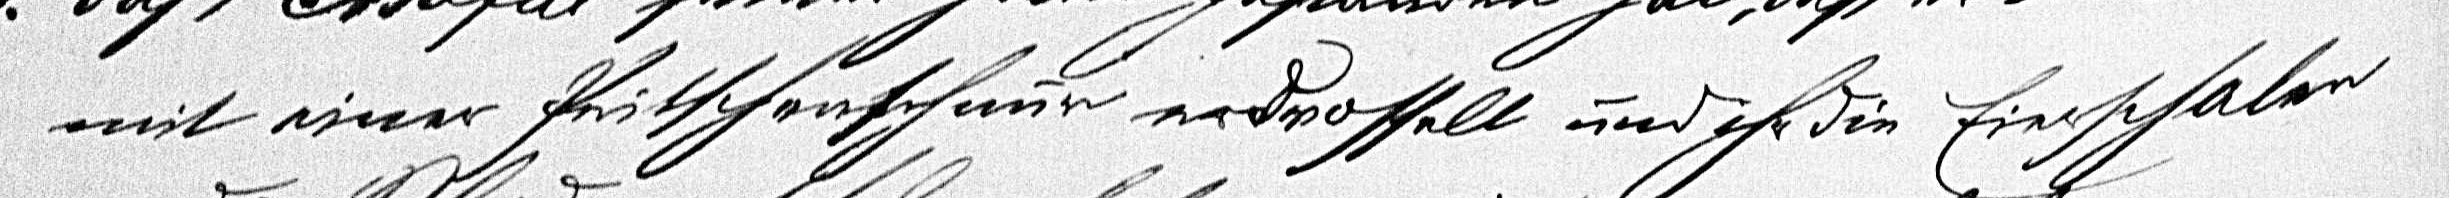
mit einer Peitschenschnur erdrosselt und ihr die Eierschalen
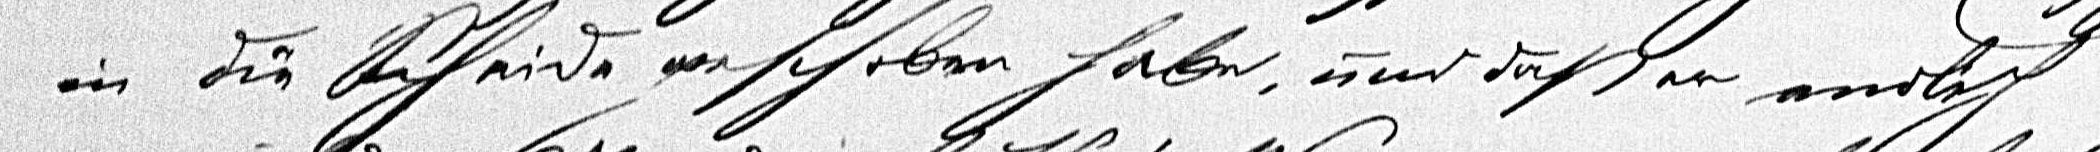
in die Scheide geschoben habe, und daß er endlich
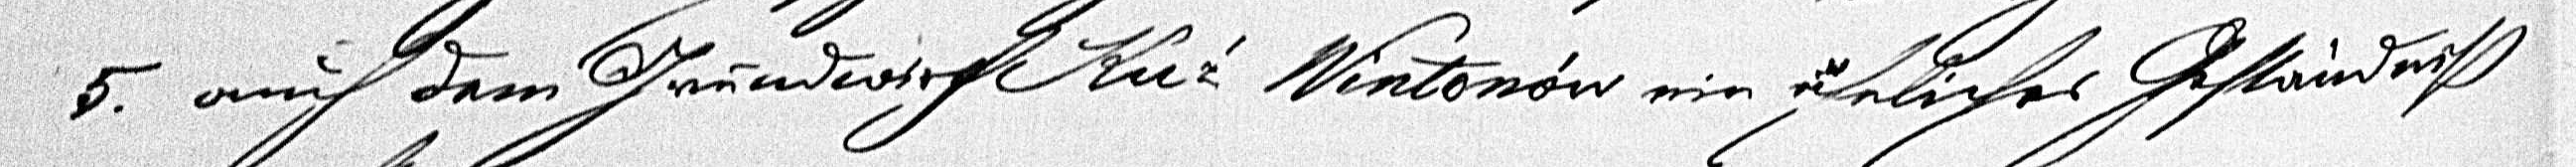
5. auch dem Grundwirth Kuź Wintonów ein ähnliches Geständniß
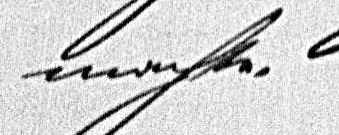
machte.
